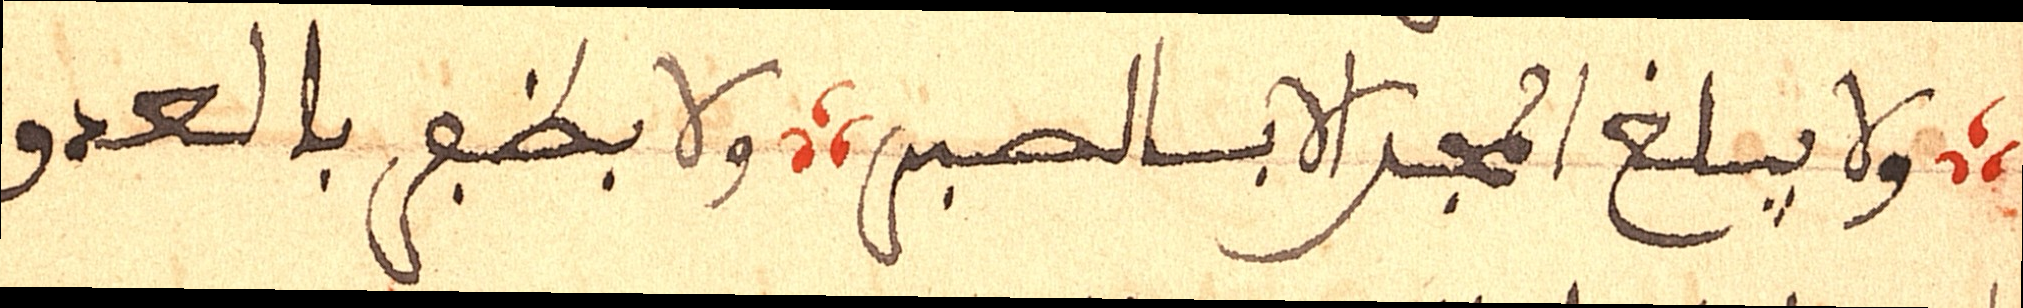ولا يبلغ المجر الا بالصبر ولا بظفر بالعدو
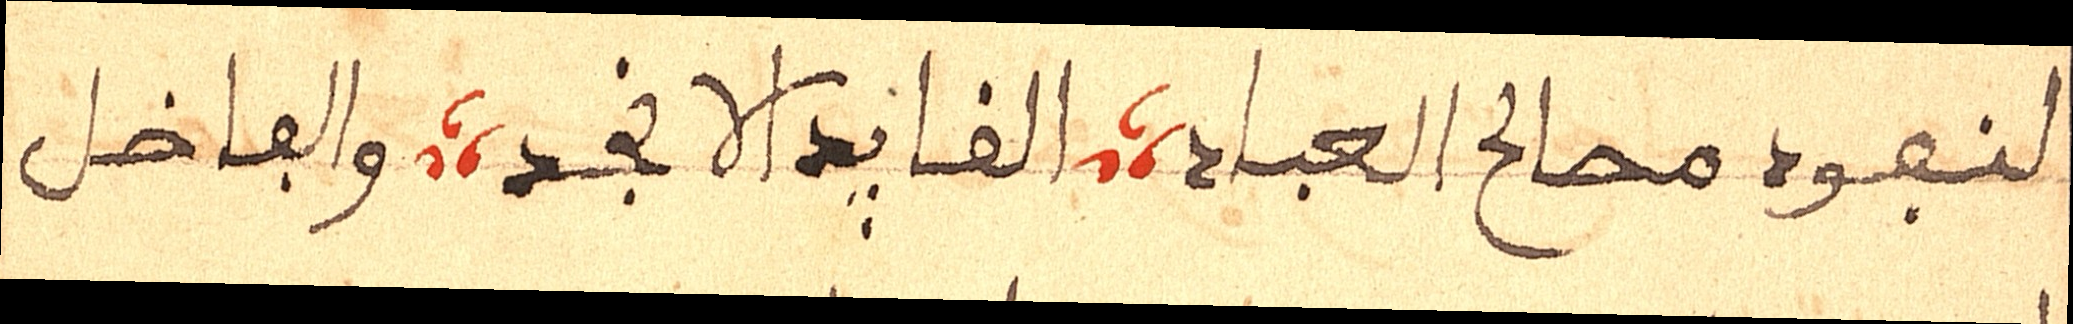لنفود مصالح العباد القائد الا نجد والفاضل
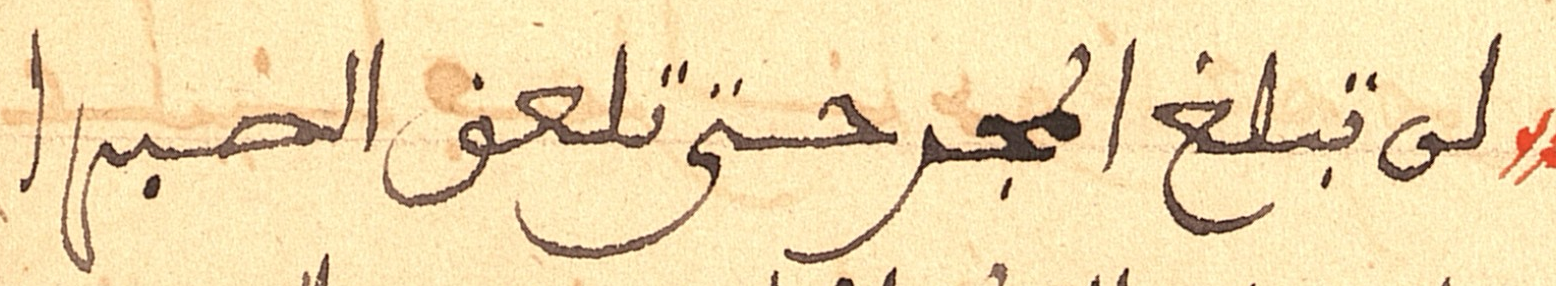لن تبلغ الجر حتى تلعق الصبرا
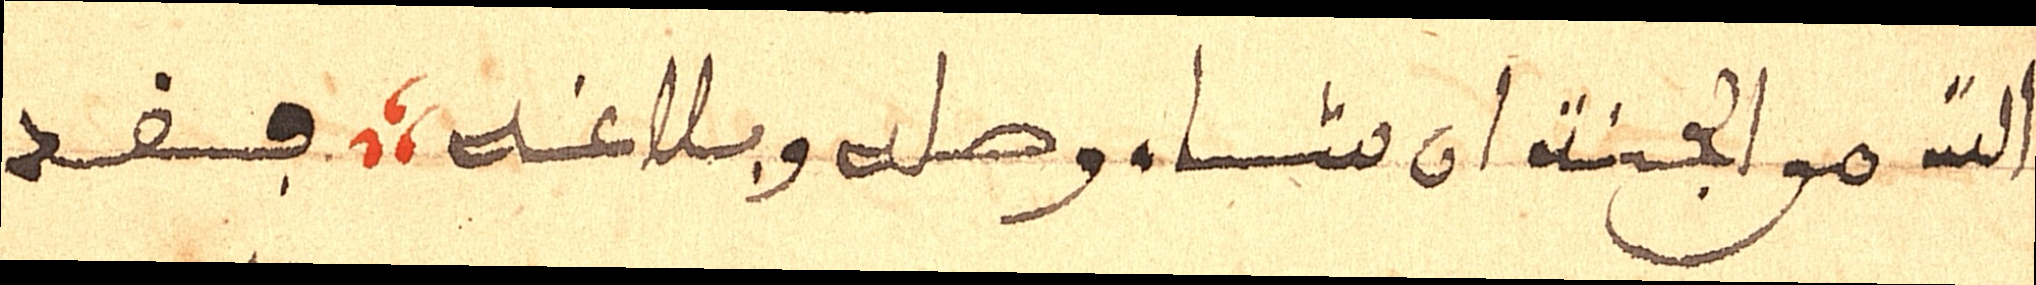الله من الجنة ان شاء وصله وبلاغة فقد
